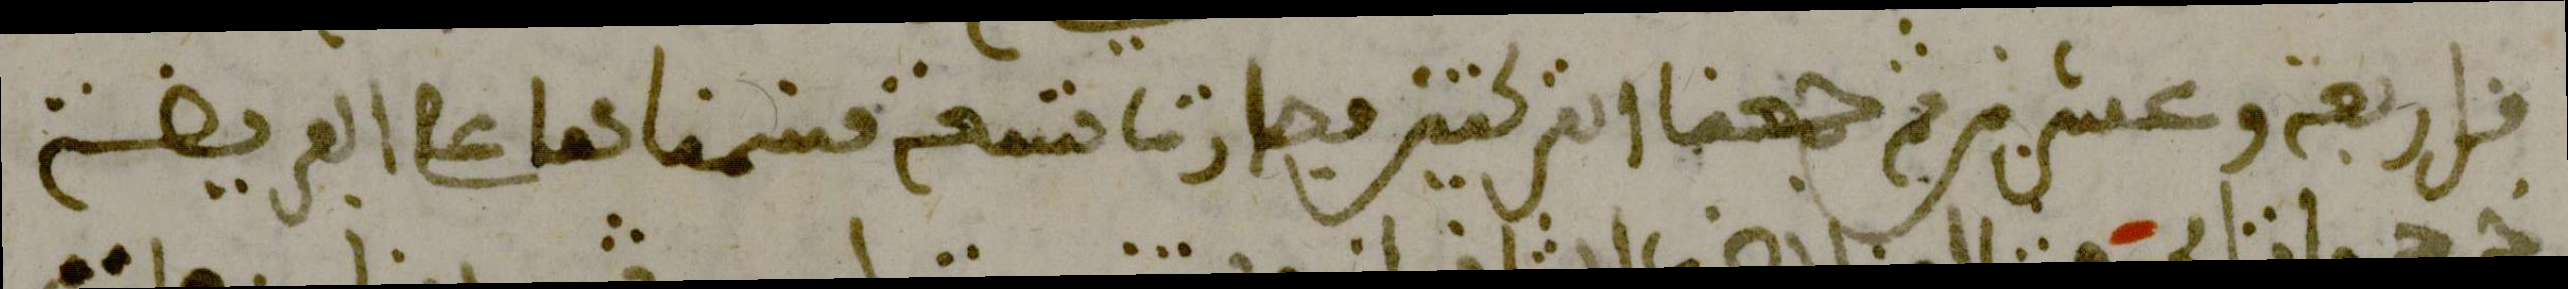من اربعة وعشرين ثم جمعنا التركتين فصارت تسعة قسمناها على الفريضة
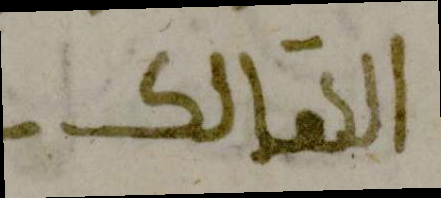الهالك
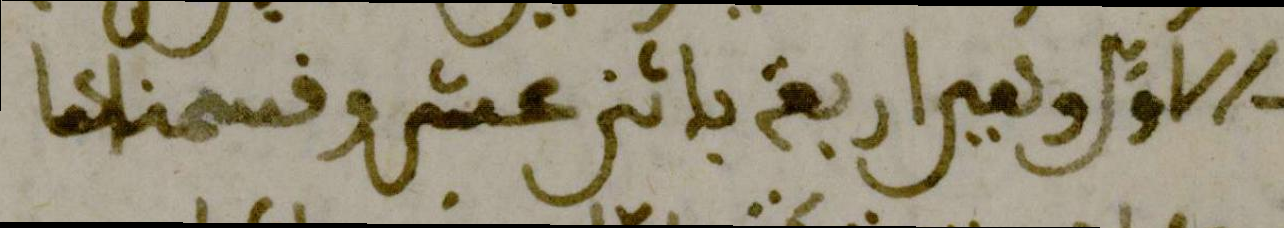الاوّل وهي اربعة باثنى عشر وقسمناها
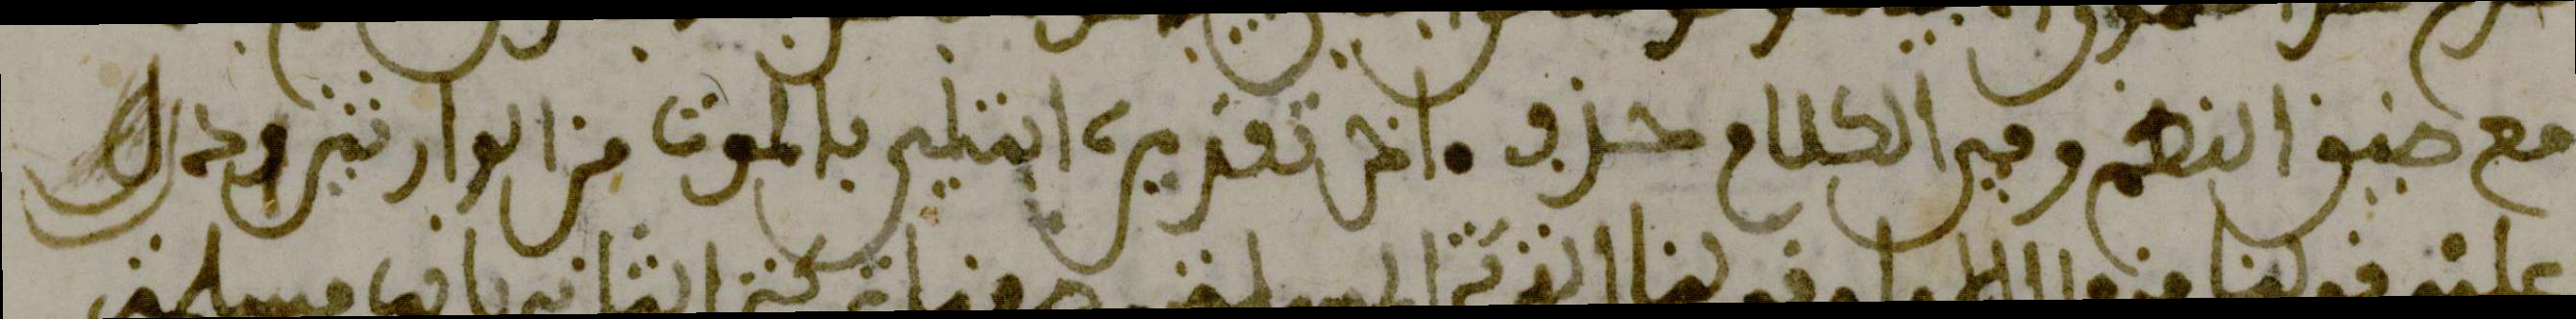مع ضيق النظم وفي الكلام حذف ءاخر تقديره ابتلي بالموت من الوارثين ودل
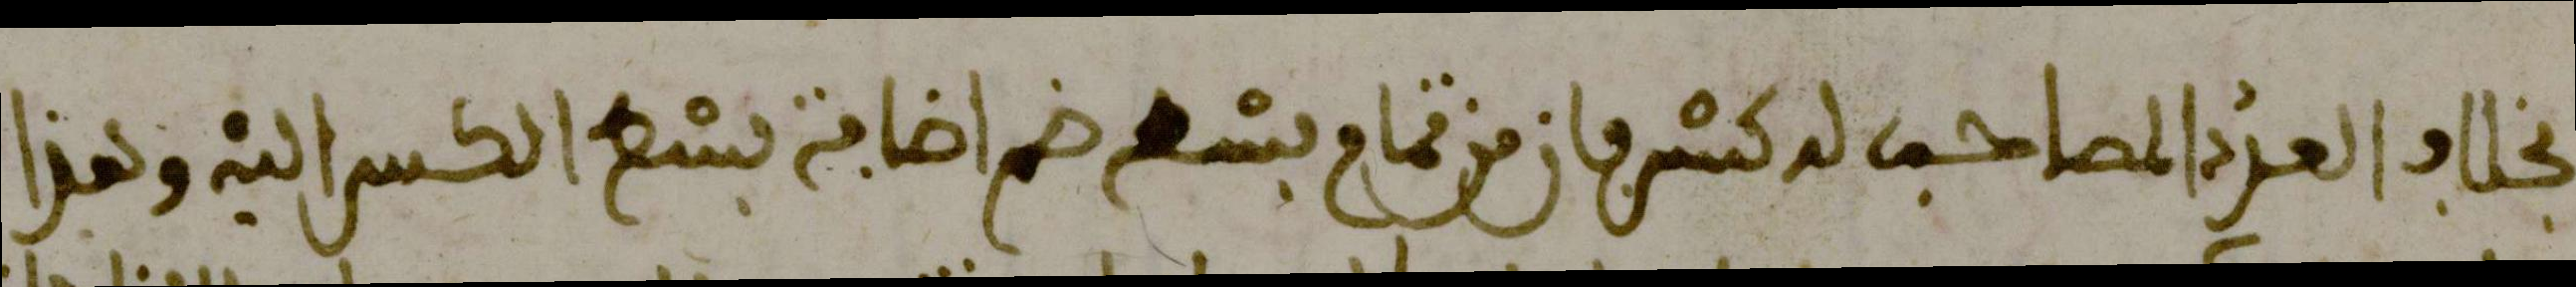بخلاف العدد المصاحب له كسر فان من تمام بسطه ضم اضافة بسط الكسر اليه وهذا
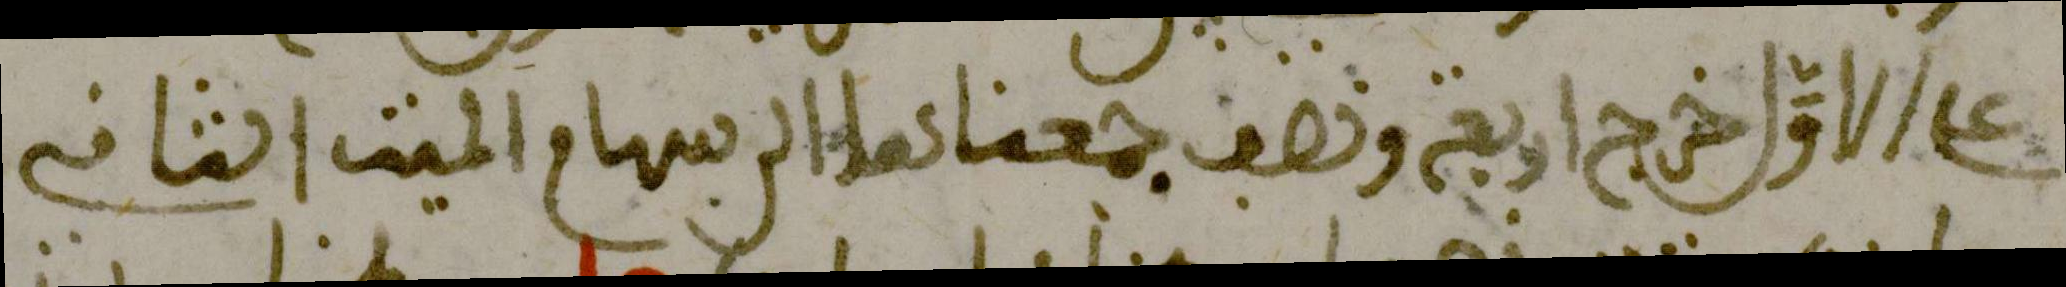على الاوّل خرج اربعة ونصف جمعناها الى سهام الميت الثاني
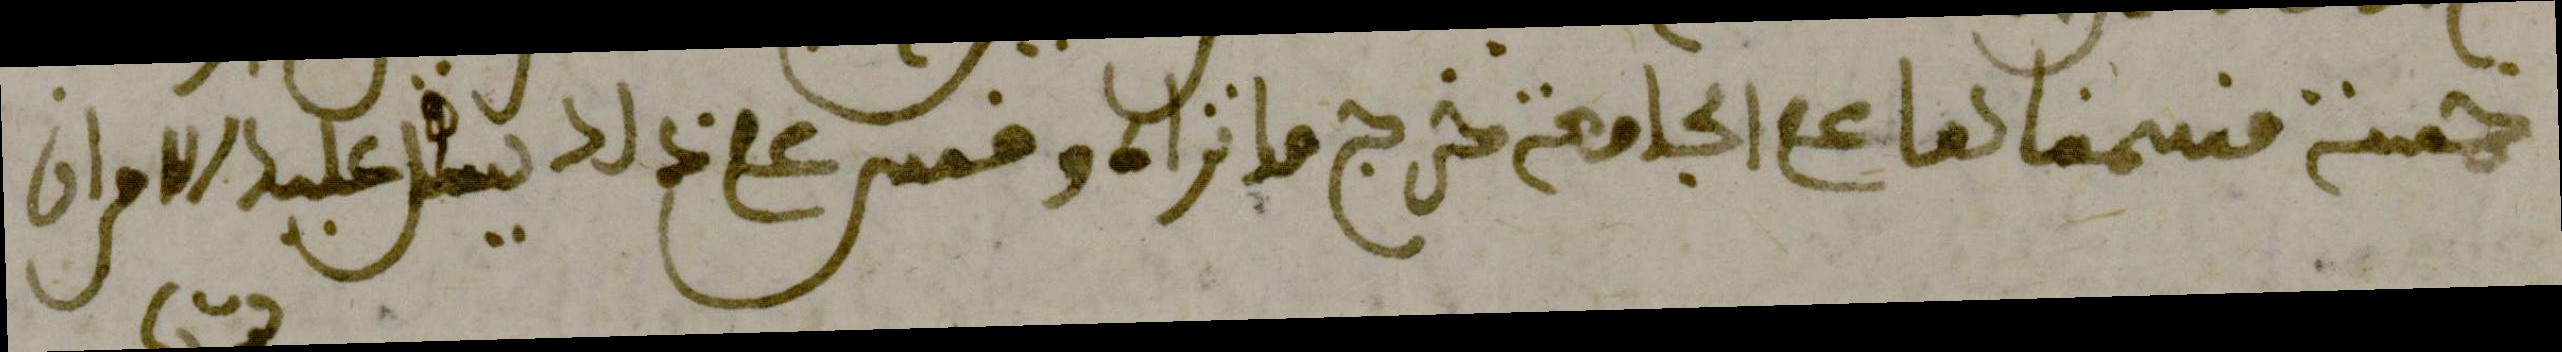خمسة قسمناها على الجامعة خرج ما تراه وقس على ذلك يسهل عليك الامران
